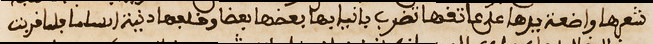شعرها واضعة يدها على عاتقها تضرب بانيابها بعضها بعضا وخلفها دنية السلما فلما قربت
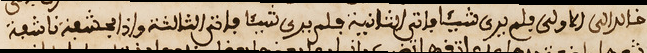خالد الى الاولى فلم يرى شيئا فاتى الثانية فلم يرى شيئا فاتى الثالثة واذا بحشفة ناشفة
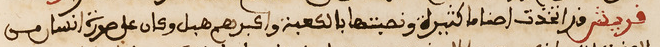قريش قد اتخذت اصناما كثيرة ونصبتها بالكعبة واكبرهم هبل وكان على صورة انسان من
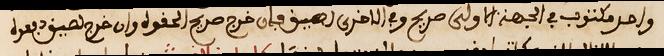واحد مكتوب في الجهة الاولى صريح وفي الاخرى لصيق فان خرج صريح الحقوه وان خرج لصيق دفعوه
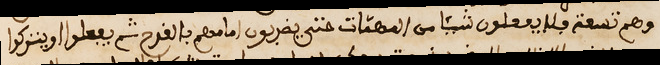وهم تسعة فلا يفعلون شيئا من المهمّات حتى يضربون امامهم بالقدح ثم يفعلوا او يتركوا
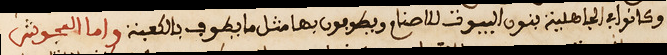وكانوا في الجاهلية بنون البيوت للاصنام ويطوفون بها مثل ما يطوف بالكعبة واما المجوش
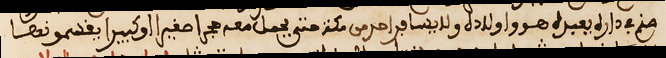صنم في داره يعبده هو واولاده ولا يسافر احد من مكة حتى يحمل معه حجرا صغيرا او كبيرا يقسمونها
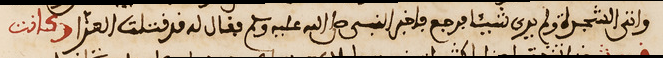واتى الشجرة ولم يرى شيئا فرجع فاخبر النبى صلى الله عليه وسلم فقال له قد قتلت العزّا وكانت
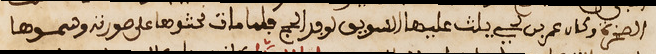الصخرة وكان عمر بن ### يلث عليها السويق لوفد الحج فلما مات نحشوها على صورته وسموها
